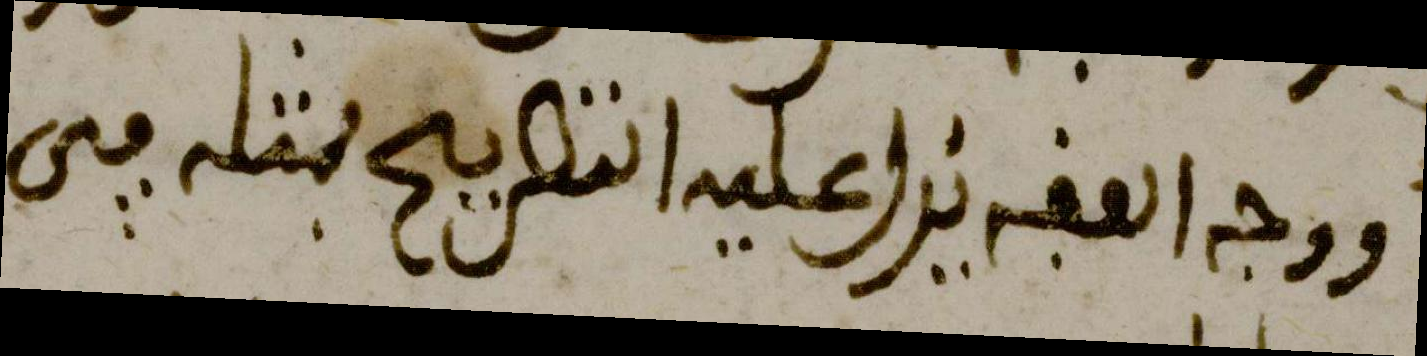وجه الفقه يدل عليه التصريح بمثله في
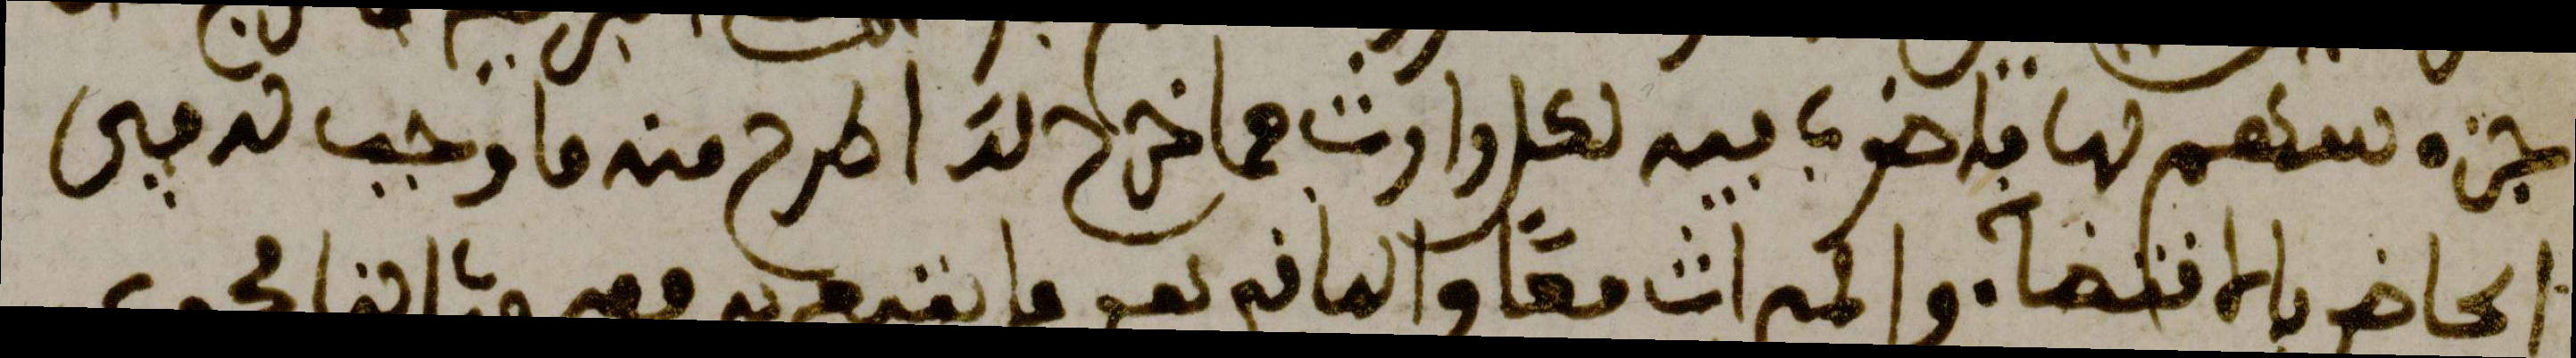جزء سهم لها فاضرب فيه لكل وارث فما خرج لك اطرح منه ما وجب له في
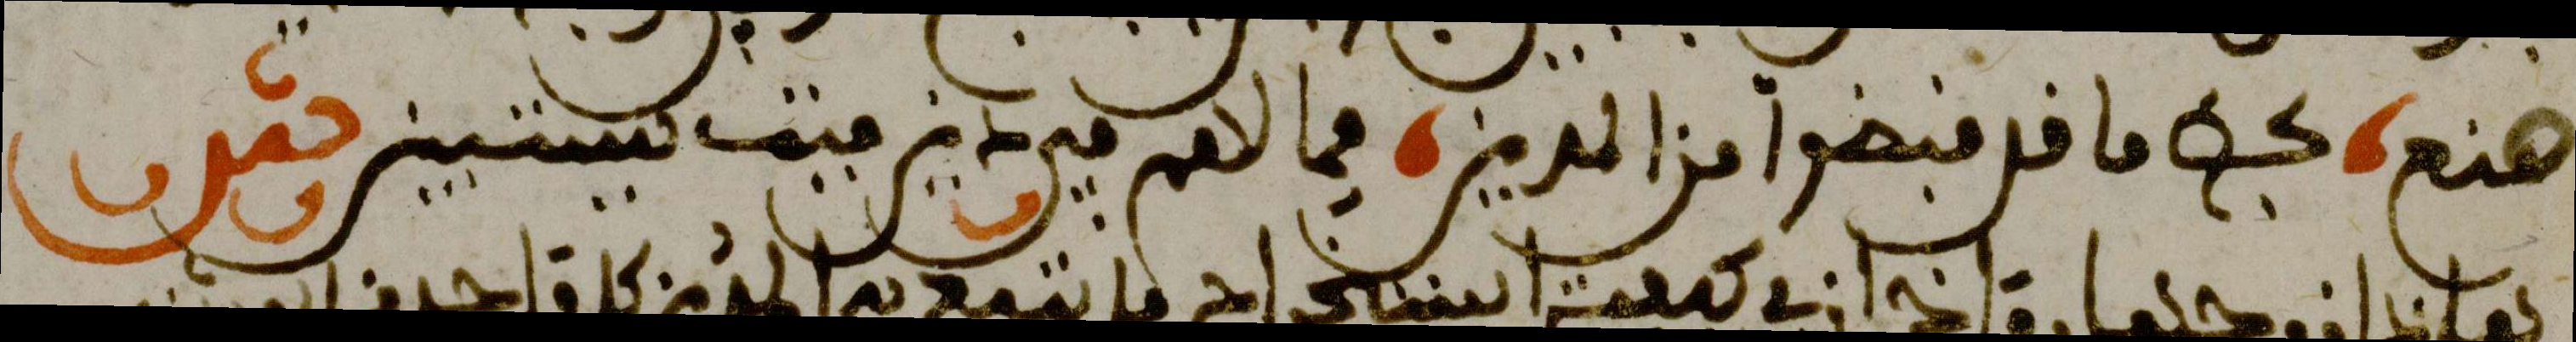صنع بحط ما قد قبضوا من المدين ممالهم في دين ميت يستمين ش
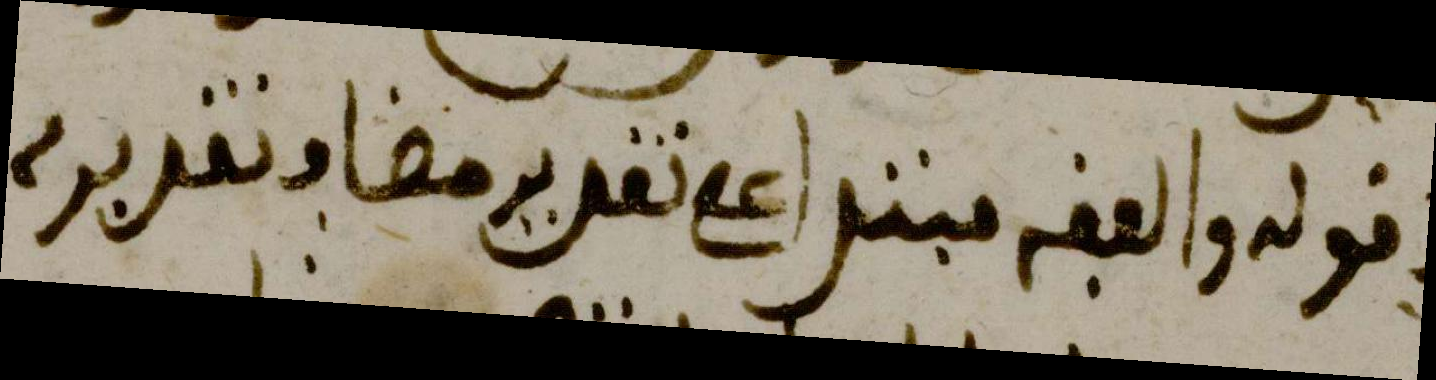قوله والفقه مبتدا على تقدير مضاف تقديره
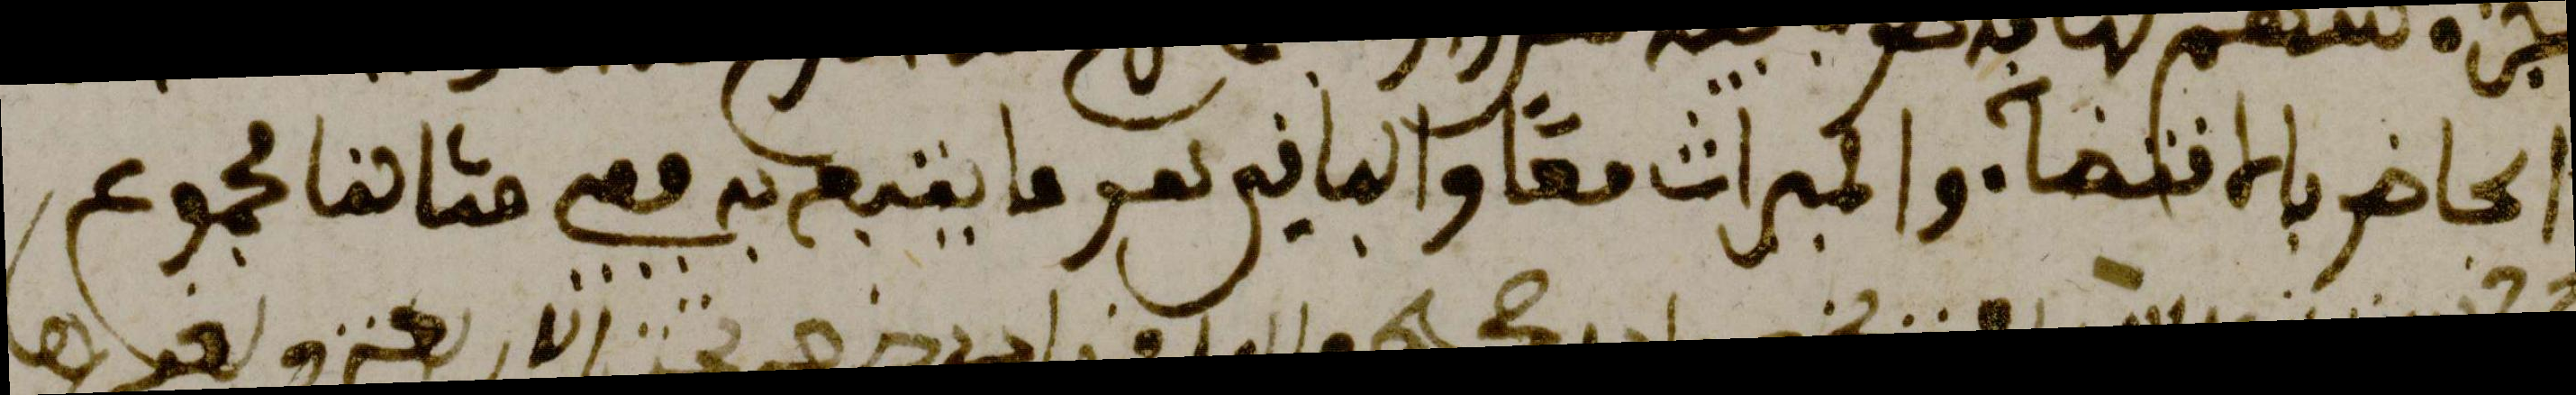الحاضر بالاقتضاء والميراث معا والباقي هو ما يتبع به ففي مثالنا مجموع
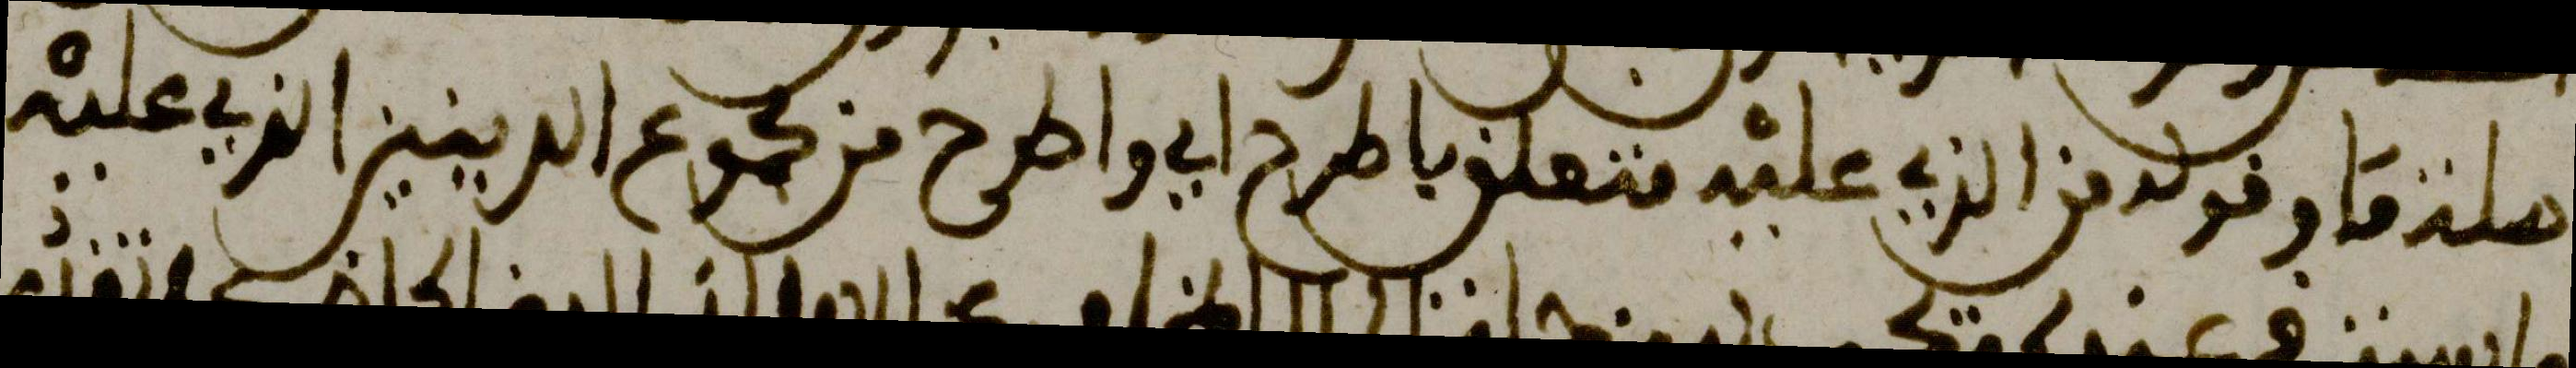صلة ما وقوله من الذي عليه متعلق باطرح اي واطرح من مجموع الدينين الذي عليه
